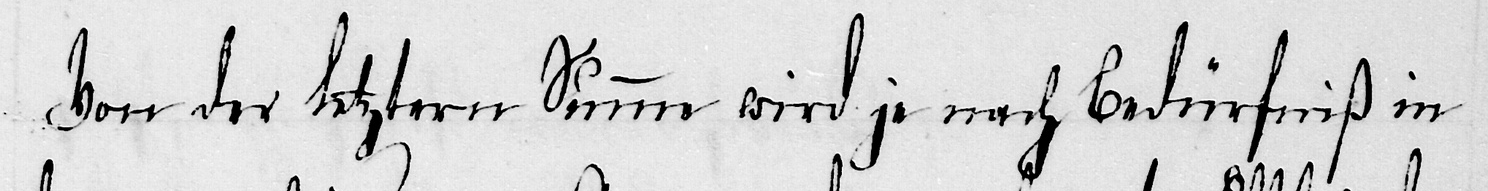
Von der letztern Summe wird je nach Bedürfniß in
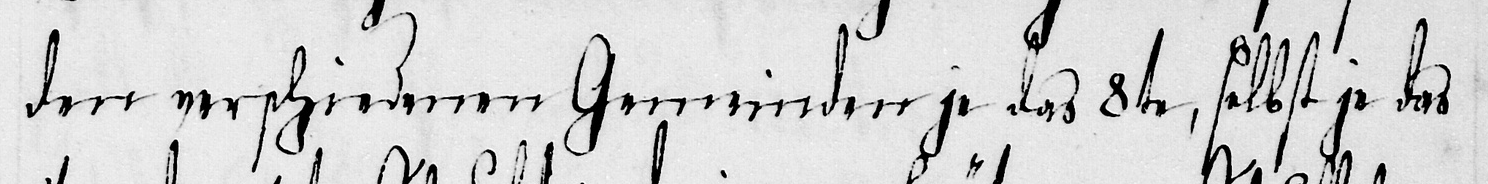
den verschiedenen Gemeinden je das 8te, selbst je das
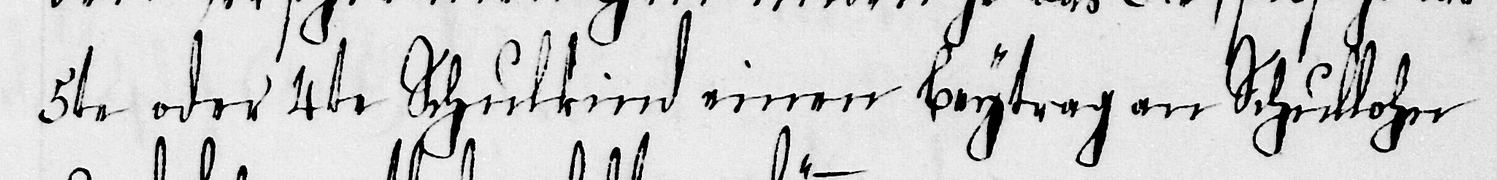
5te oder 4te Schulkind einen Beytrag an Schullohn
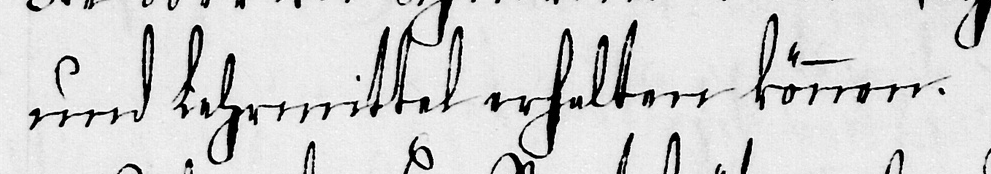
und Lehrmittel erhalten können.
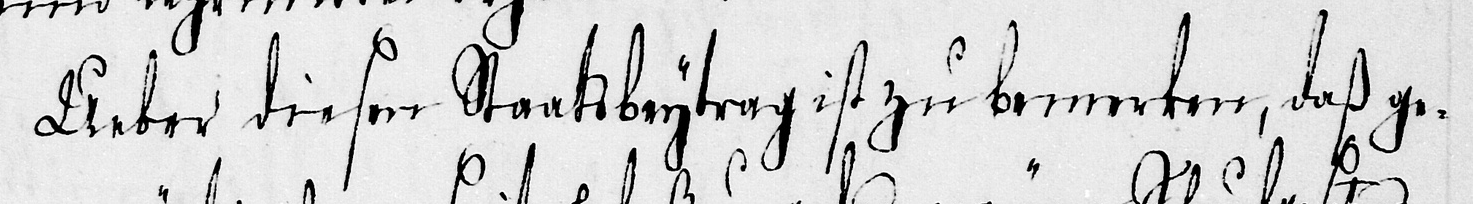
Ueber diesen Staatsbeytrag ist zu bemerken, daß ge¬
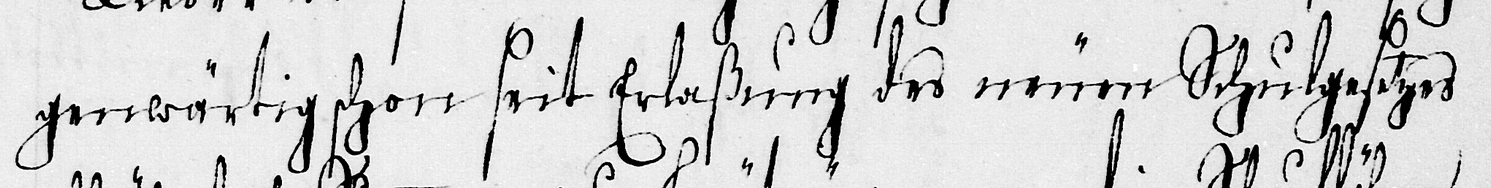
genwärtig schon seit Erlaßung des neuen Schulgesetzes
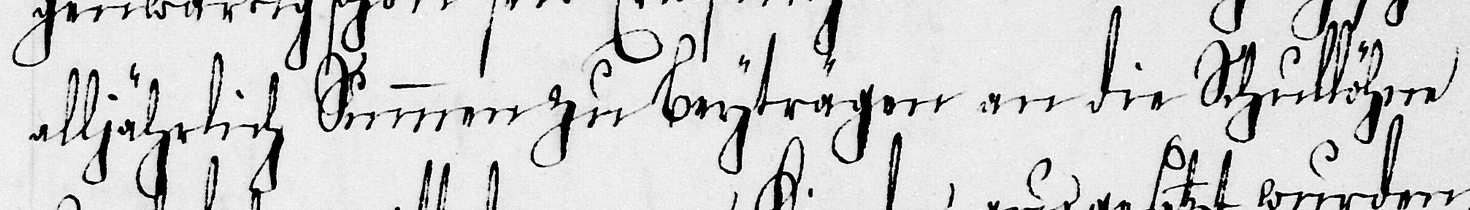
alljährlich Summen zu Beyträgen an die Schullöhne
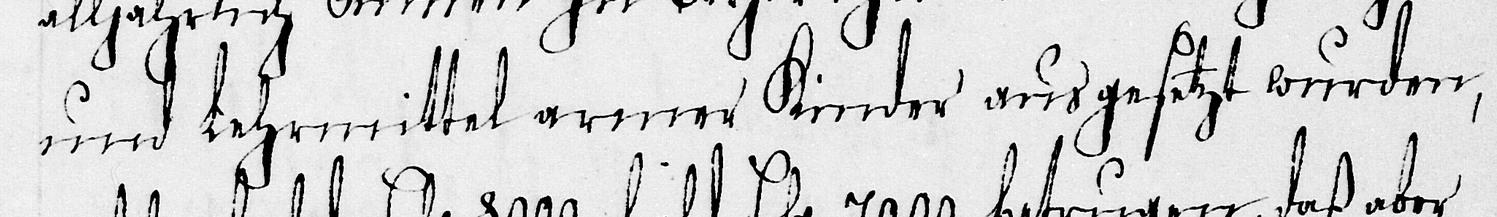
und Lehrmittel armer Kinder ausgesetzt wurden,
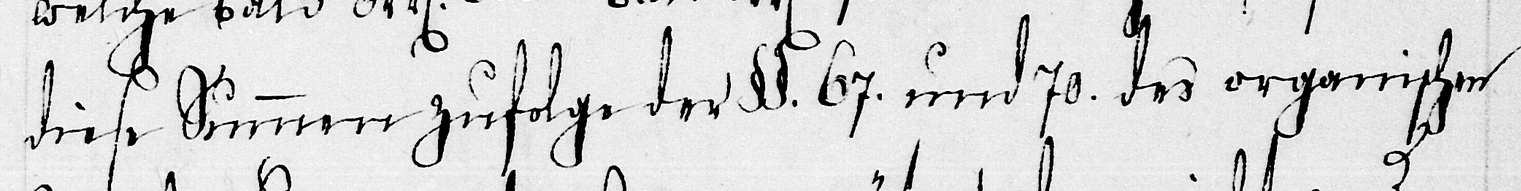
diese Summen zufolge der §§. 67. und 70. des organischen
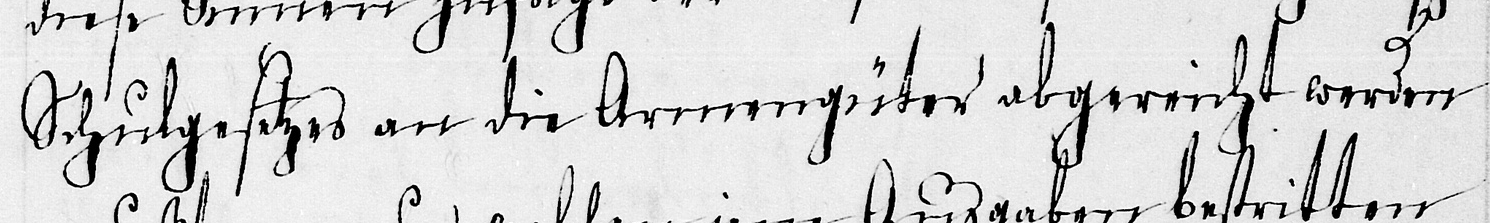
Schulgesetzes an die Armengüter abgereicht werden
